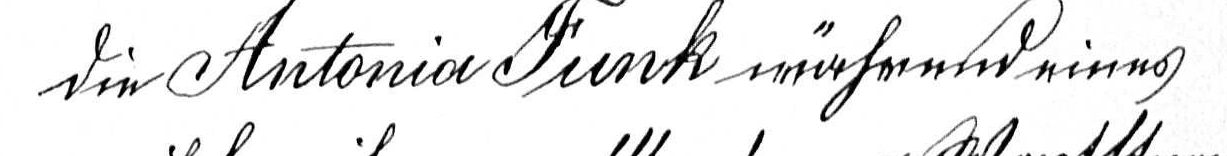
die Antonia Funk während eines
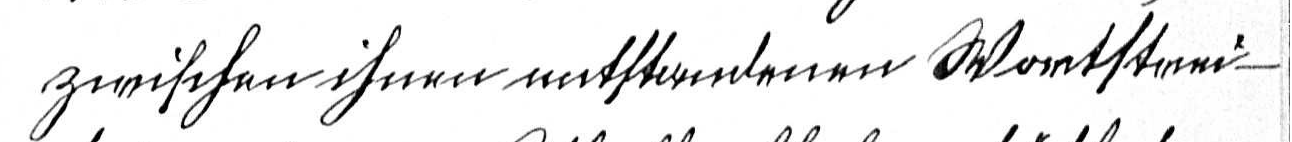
zwischen ihnen entstandenen Wortstrei¬
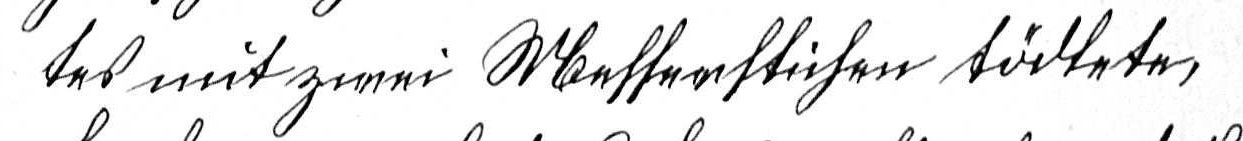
tes mit zwei Messerstiche tödtete,
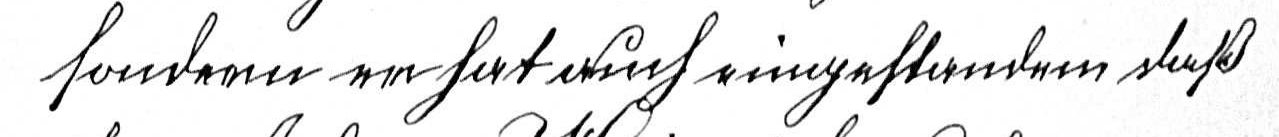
sondern er hat auch eingestanden daß
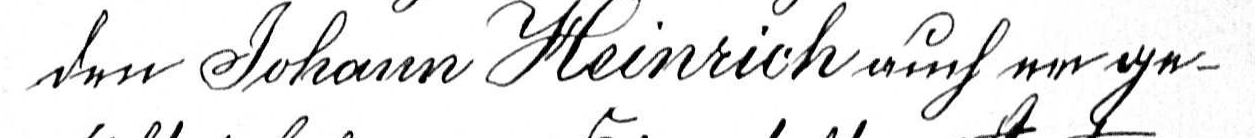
den Johann Heinrich auch er ge¬
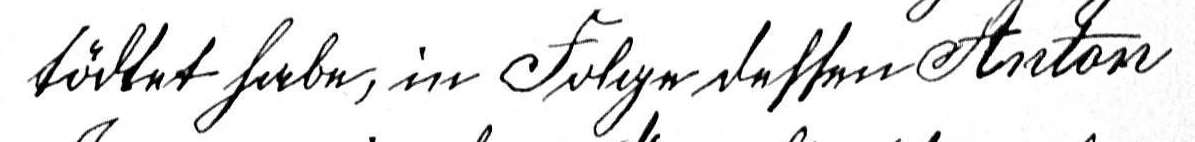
tödtet habe, in Folge dessen Anton
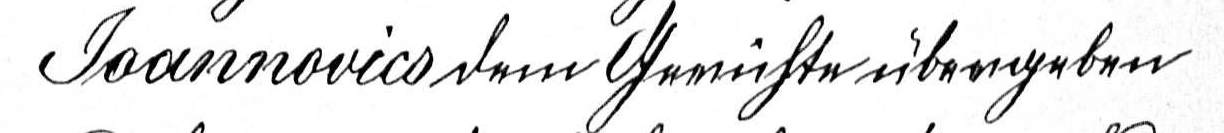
Joannovics dem Gerichte übergeben
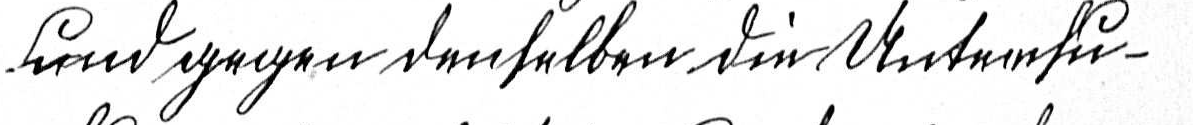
und gegen denselben die Untersu¬
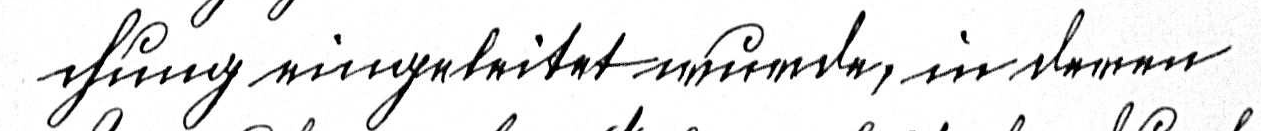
chung eingeleitet wurde, in deren
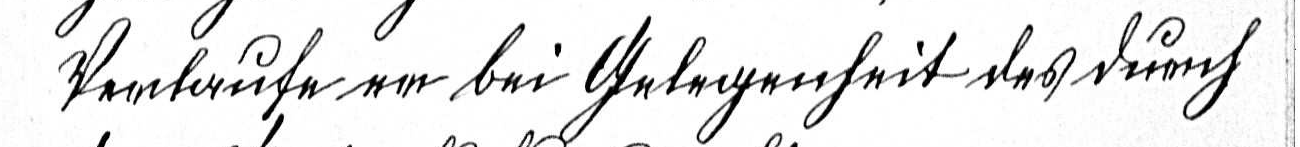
Verlaufe er bei Gelegenheit des durch
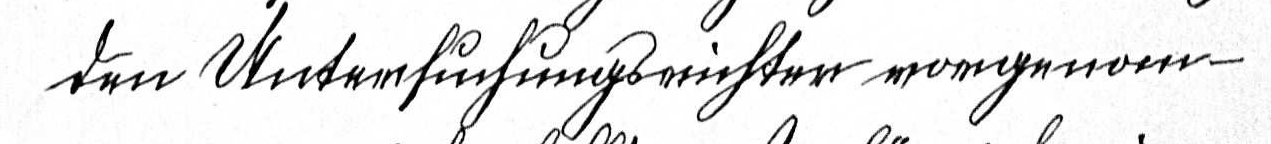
den Untersuchungsrichter vorgenom¬
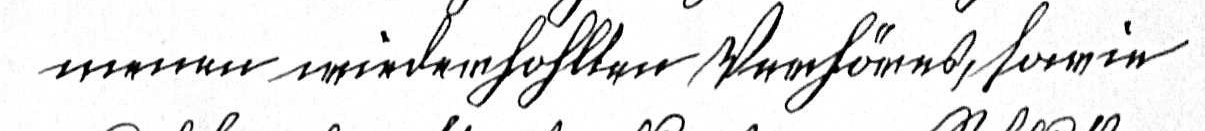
men wiederholten Vehöres, sowie
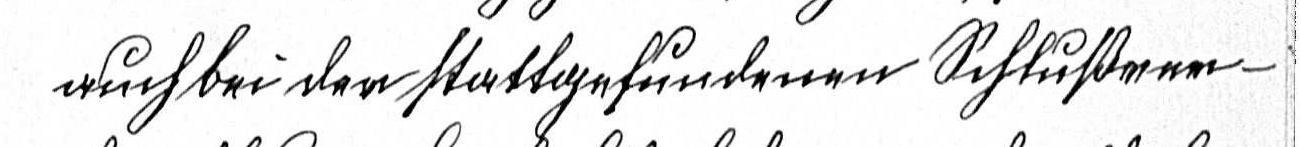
auch bei der stattgefundenen Schlußver¬
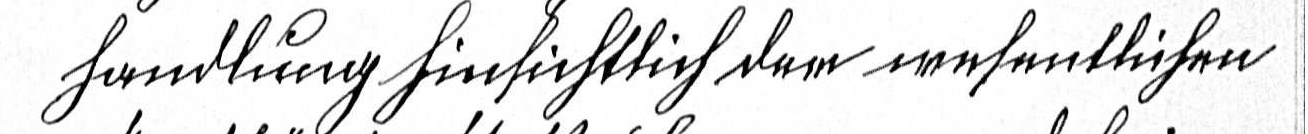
handlung hinsichtlich der wesentlichen
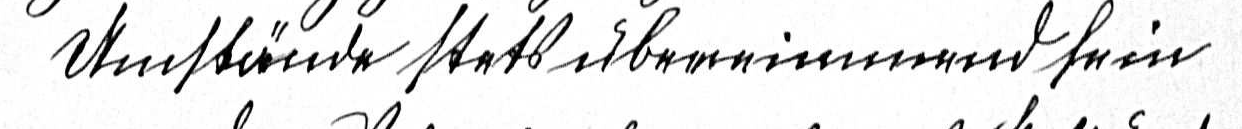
Umstände stets übereinerend sein
